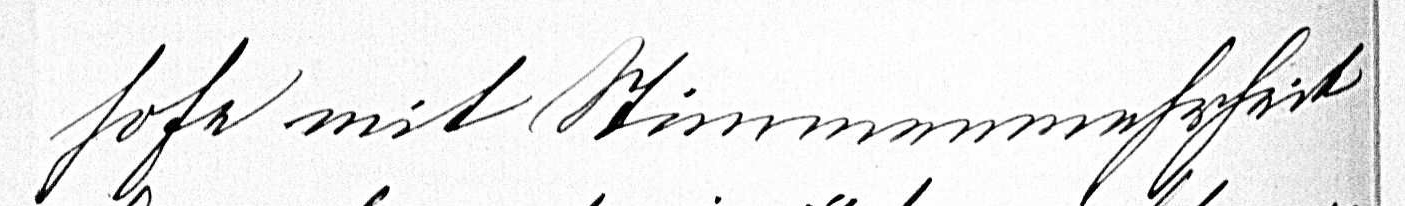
hofe mit Stimmenmehrheit
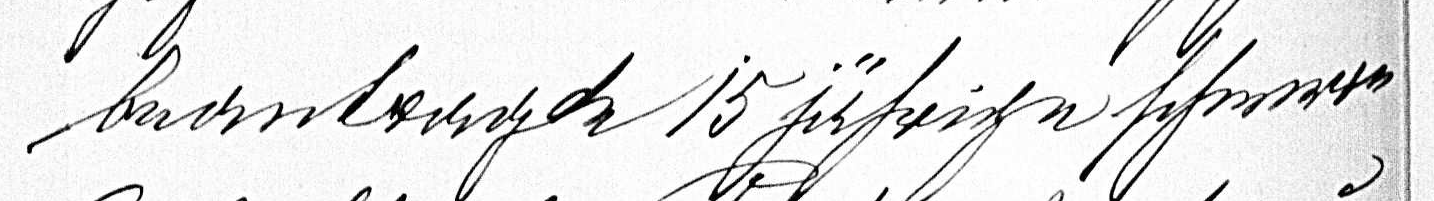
beantragte 15jährige schwerer
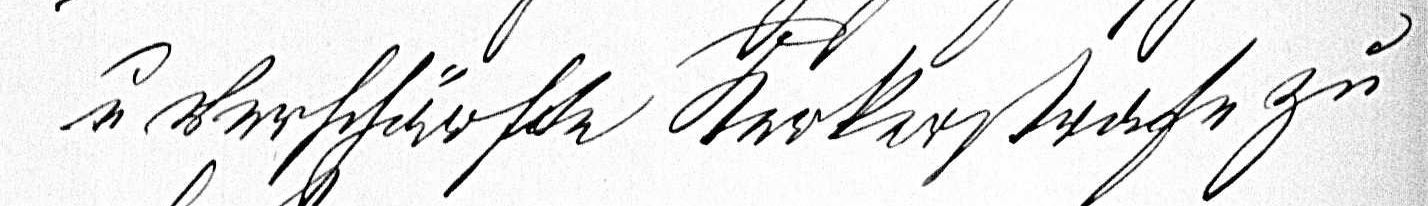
und verschärfte Kerkerstrafe zu
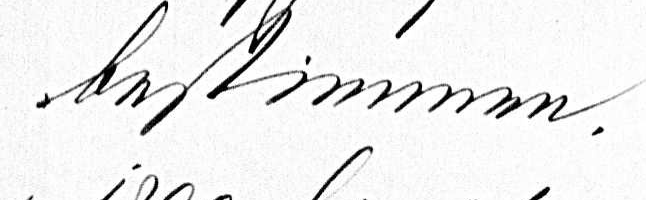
bestimmen.
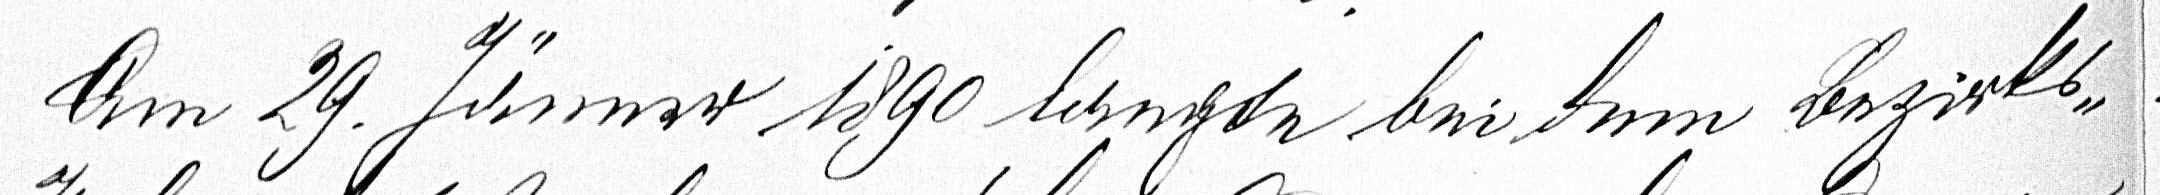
Am 29 Jänner 1890 langte bei dem Bezirks¬
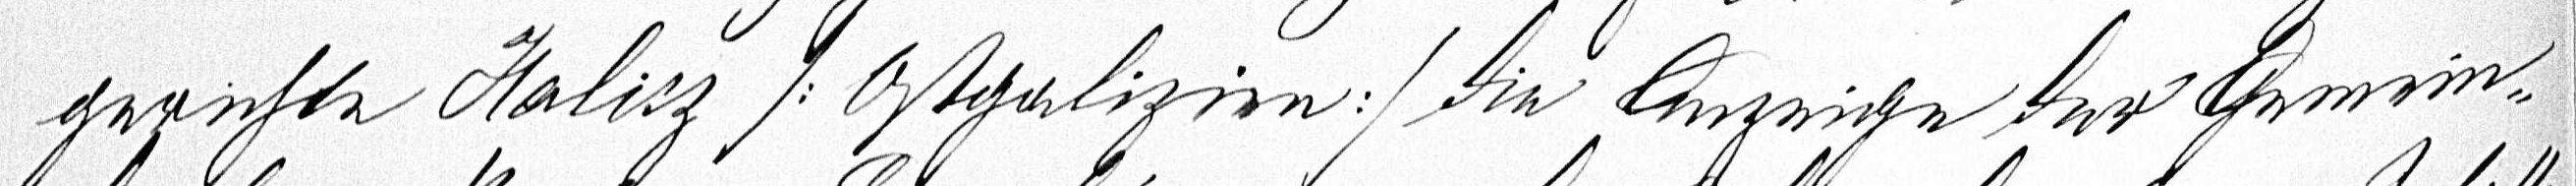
gerichte Halicz (Ostgalizien) die Anzeige der Gemein¬
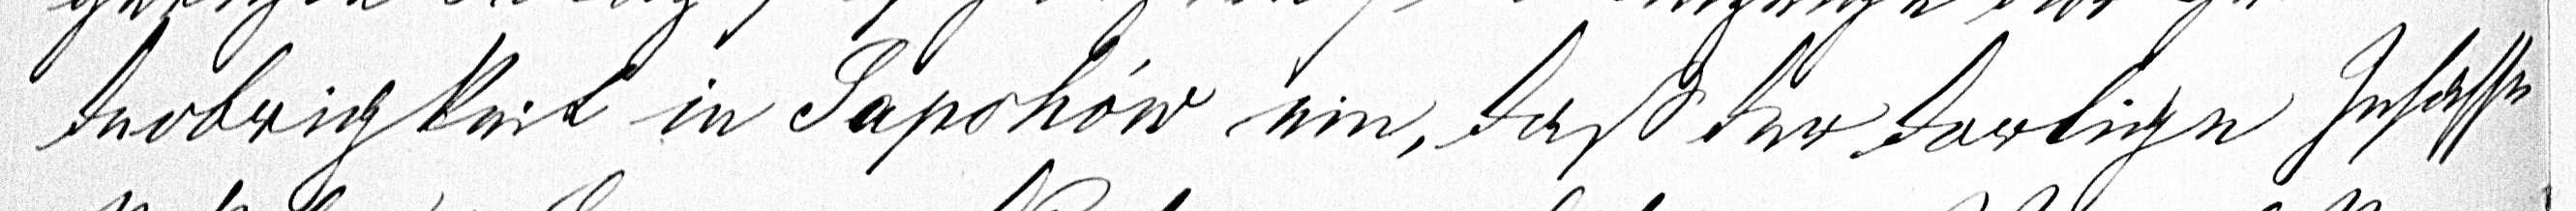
deobrigkeit in Sapohów ein, daß der darlige Insasse
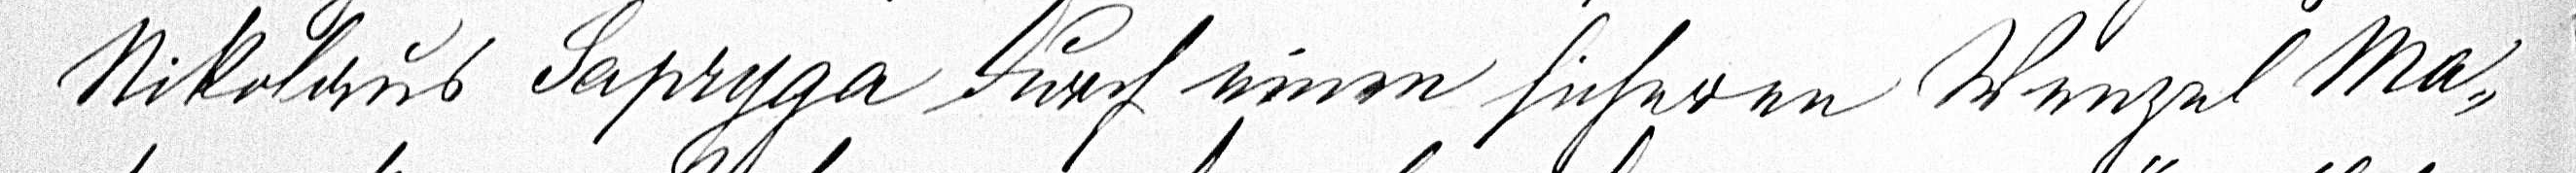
Nikolaus Sapryga durch einen sicheren Wenzel Ma¬
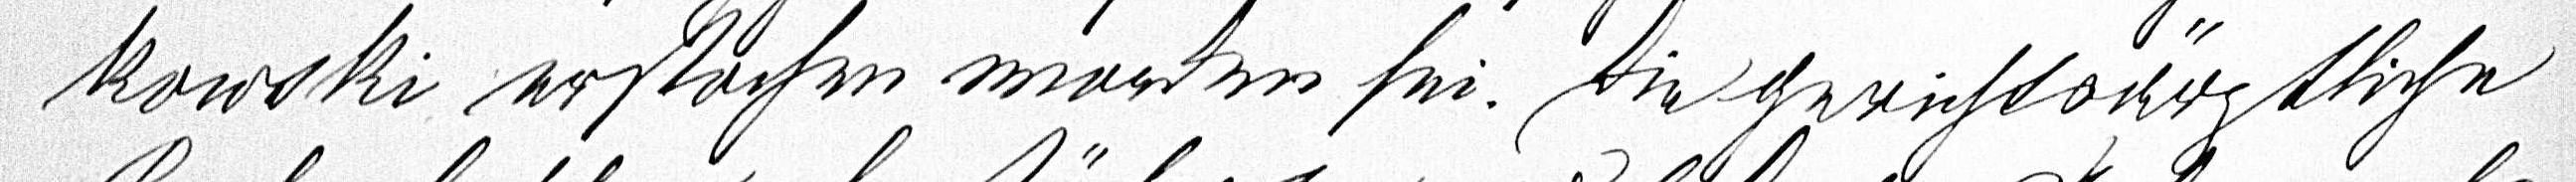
kowski erstochen worden sei. Die gerichtärztliche
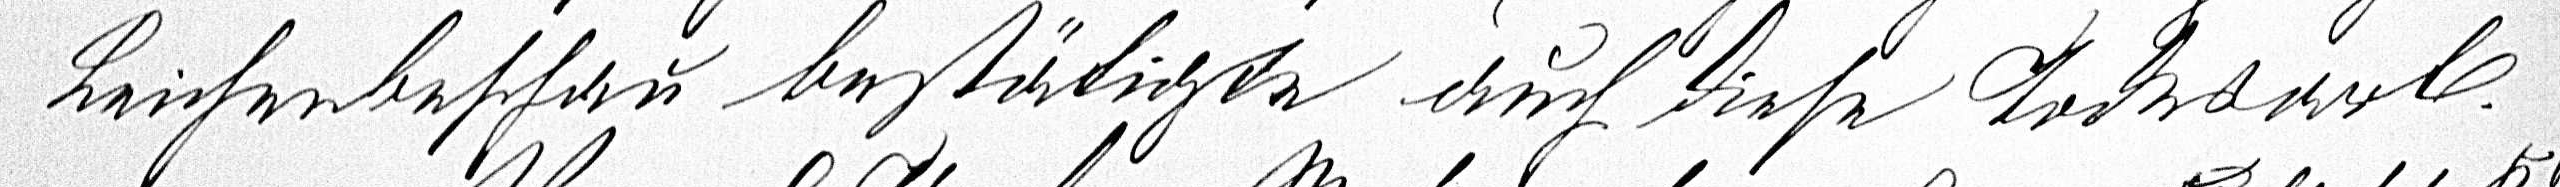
Leichenbeschau bestätigte auch diese Todesart.
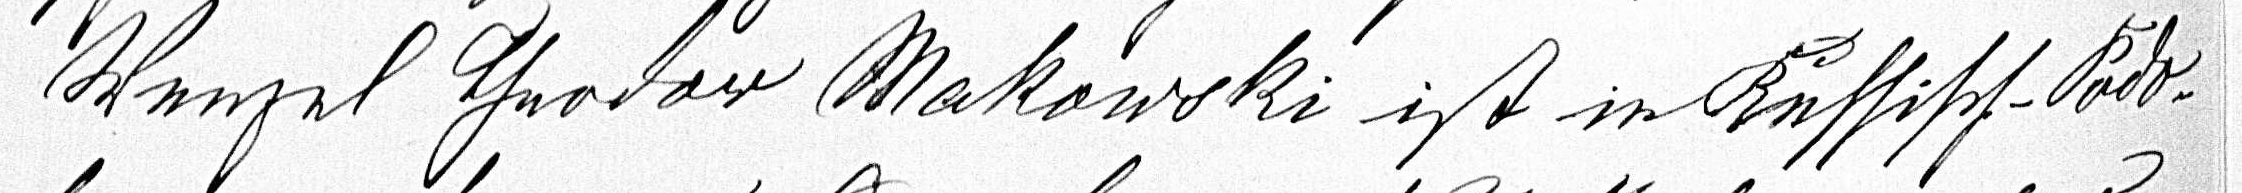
Wenzel Theodor Makowski ist in Russisch-Podo¬
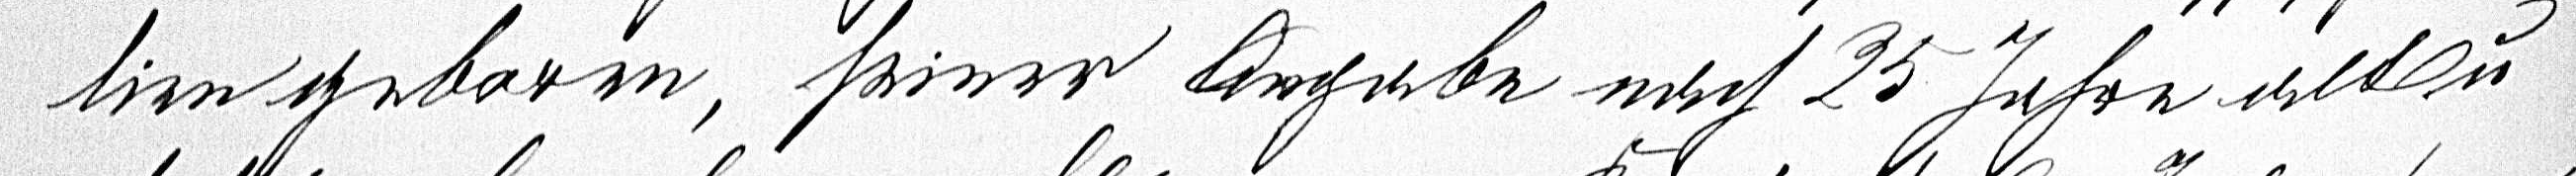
lien geboren, seiner Angabe nach 35 Jahre alt u
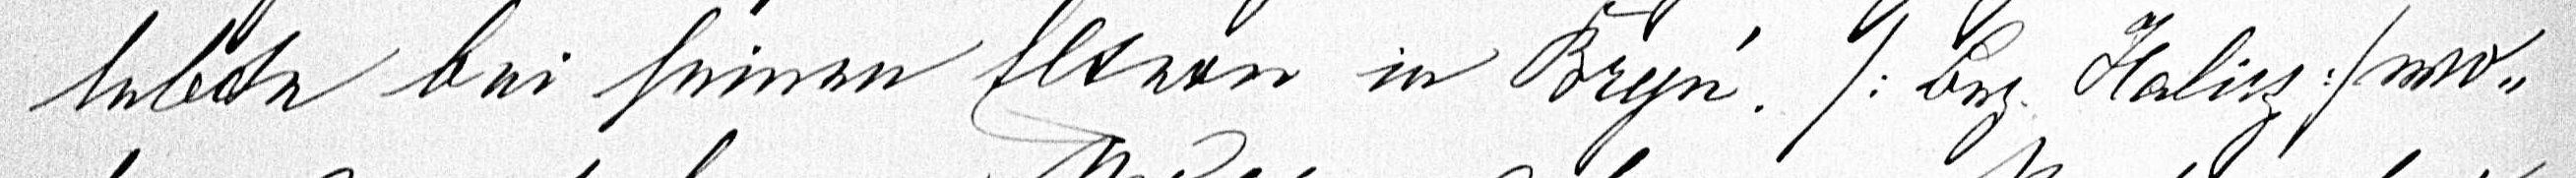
lebte bei seinen Eltern in Bryń (Bez. Halicz) wo¬
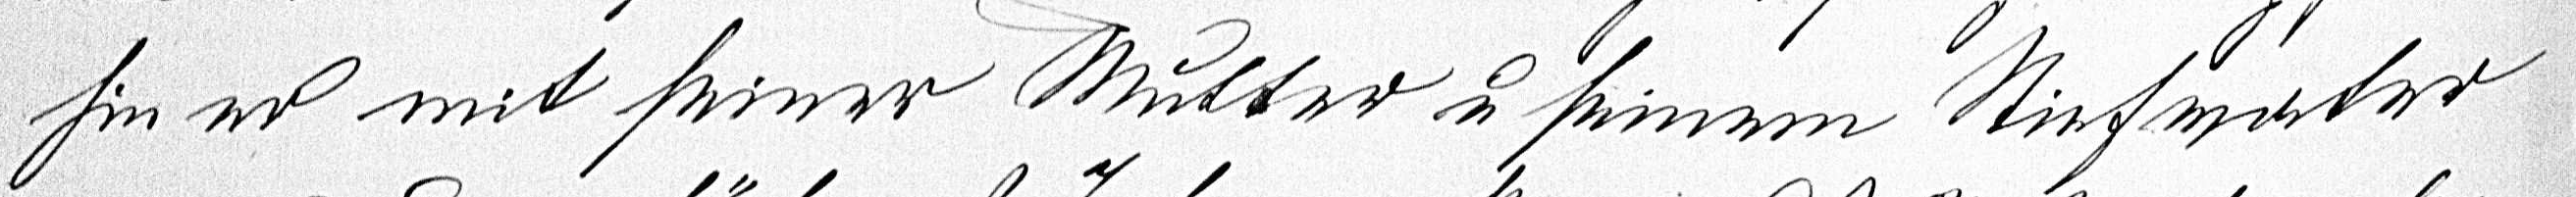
hin er mit seiner Mutter u seinem Stiefvater
